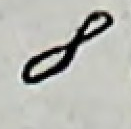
8
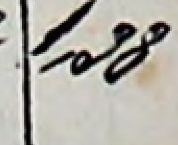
1,38
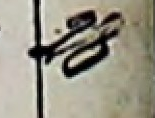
28
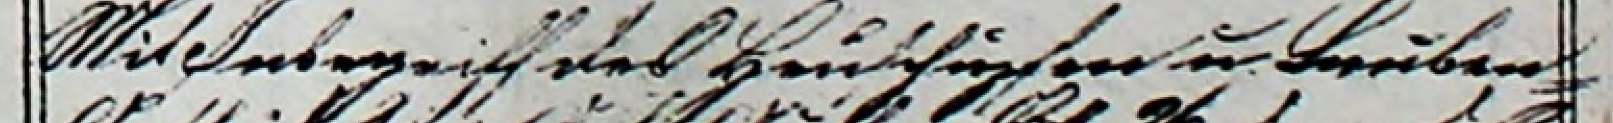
Mit Inbegriff Hauschupsen u. Bauben=
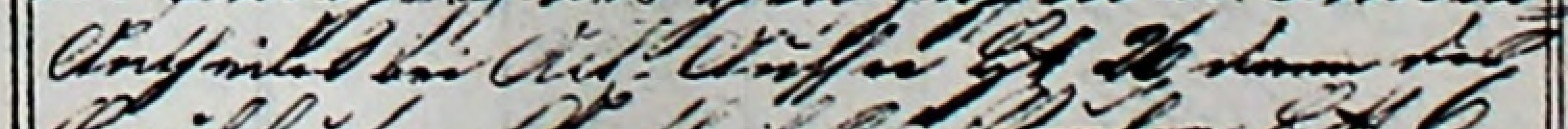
Antheiles bei Alt-Aussee H? 26 dann des
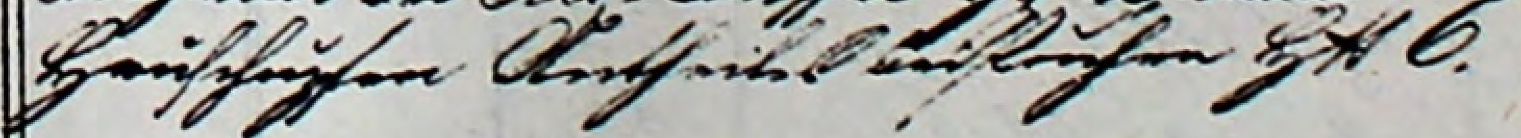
Hauschupsen Antheiles bei Puchen H? 6.
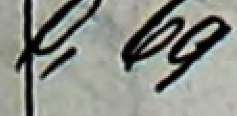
0,69
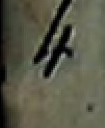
4
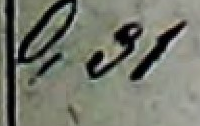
0,31
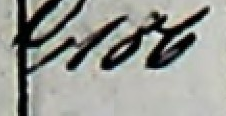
0,186
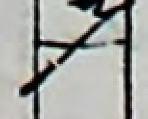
7
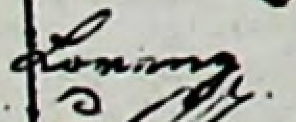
Lorenz
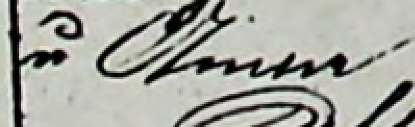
u Anna
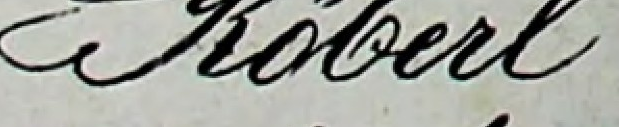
Köberl
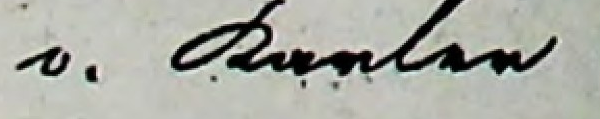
v. Karler
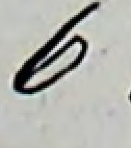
6
